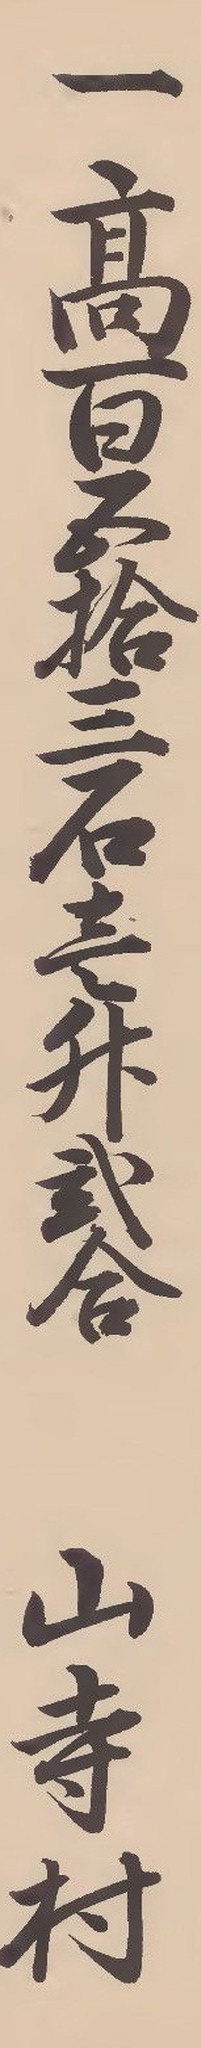一高百五拾三石壱升弐合山寺村
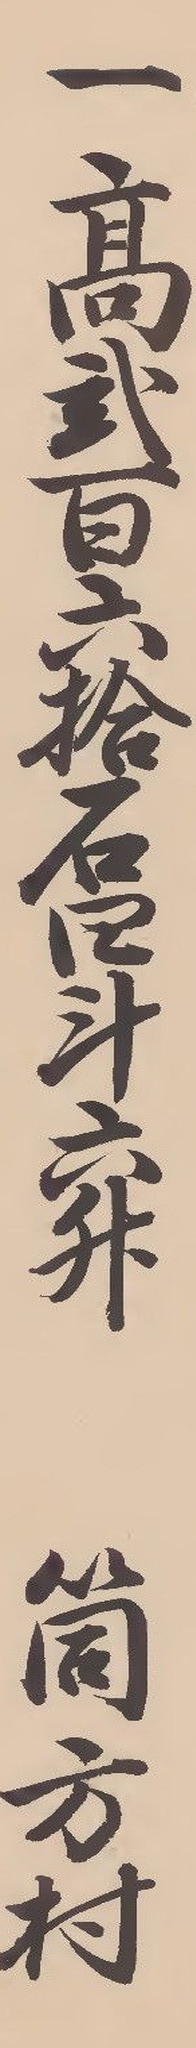一高弐百六拾石四斗六升筒方村
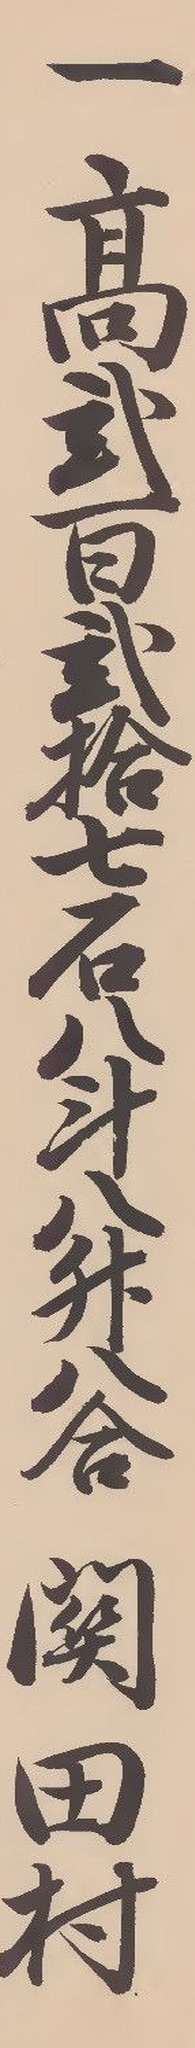一高弐百弐拾七石八斗八升八合関田村
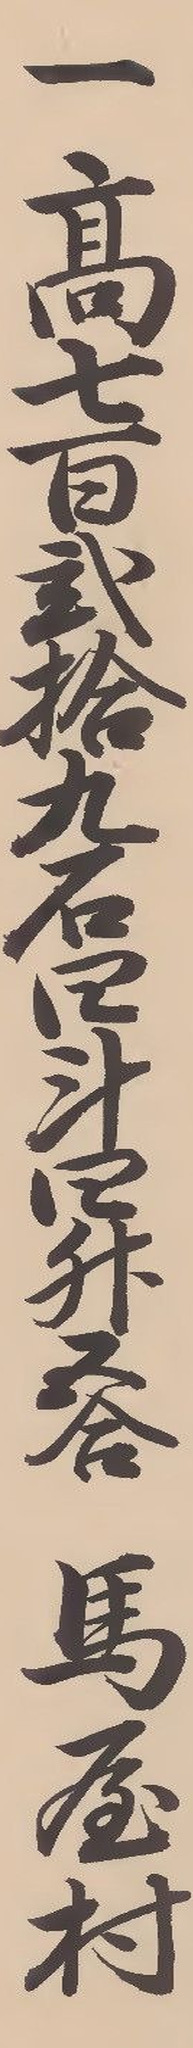一高七百弐拾九石四斗四升五合馬屋村
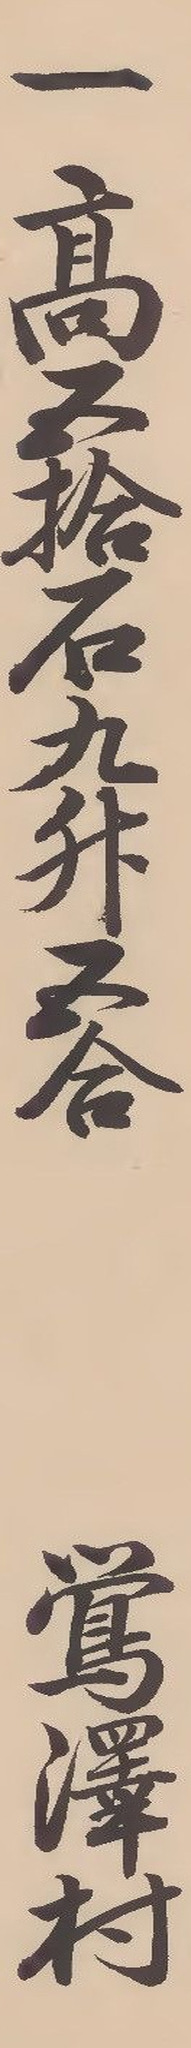一高五拾石九升五合鶯沢村
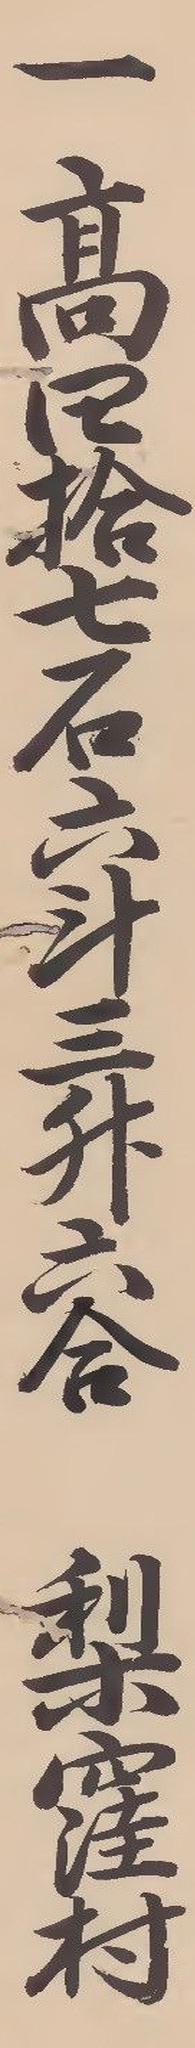一高四拾七石六斗三升六合梨窪村

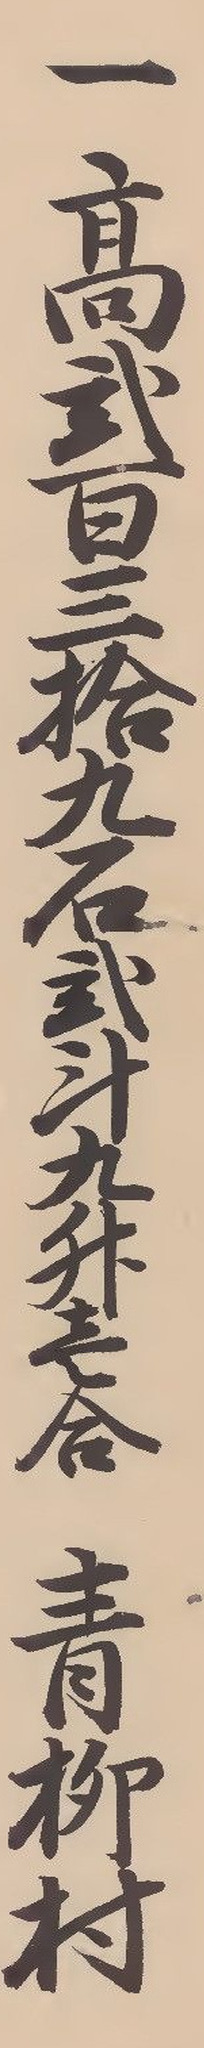一高弐百三拾九石弐斗九升壱合青柳村
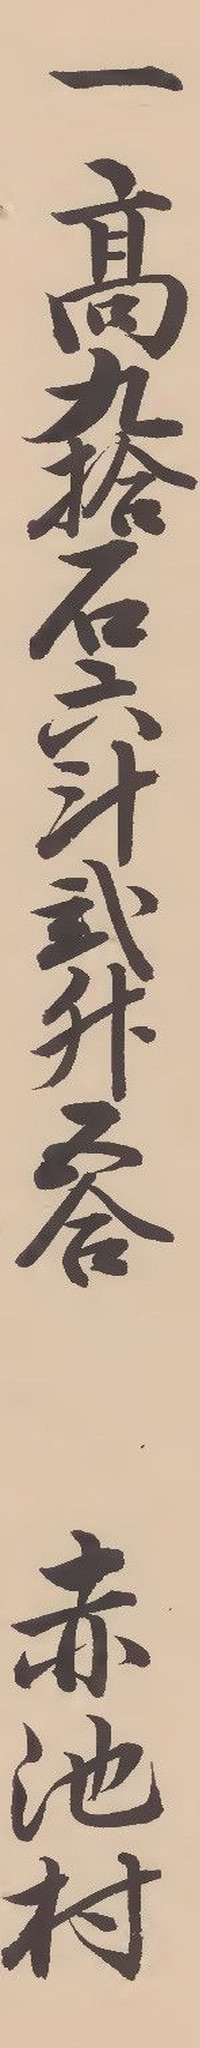一高九拾石六斗弐升五合赤池村
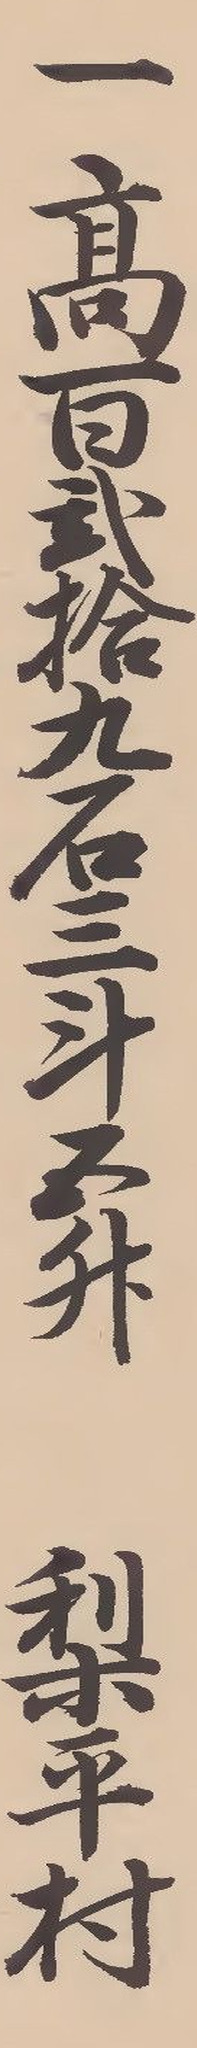一高百弐拾九石三斗五升梨平村
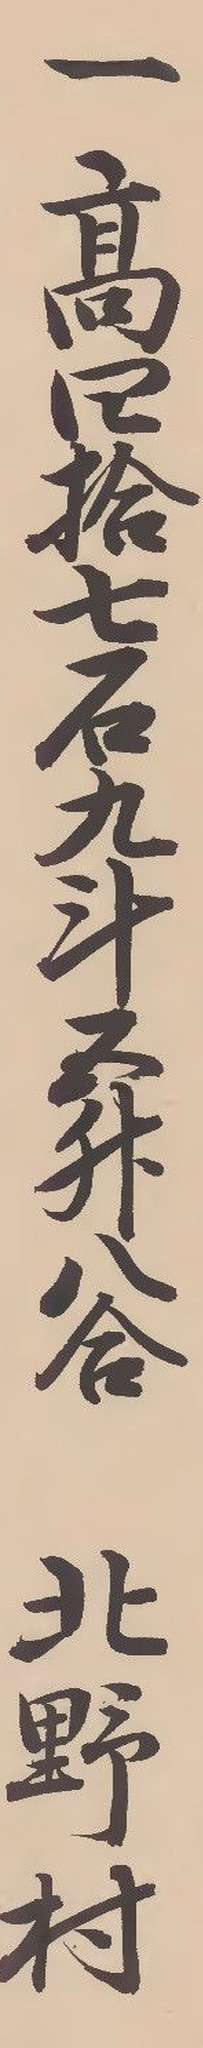一高四拾七石九斗五升八合北野村
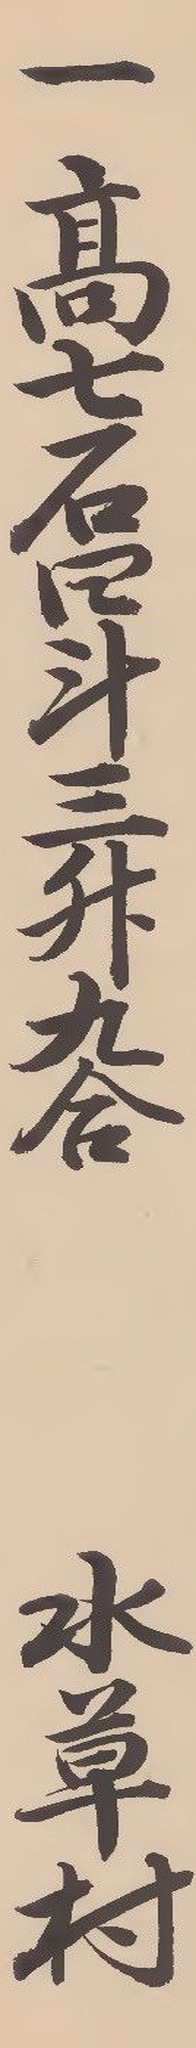一高七石四斗三升九合水草村
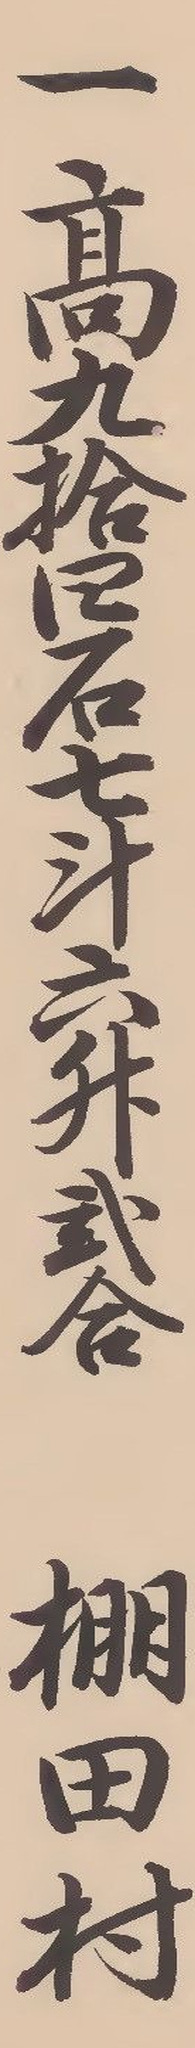一高九拾四石七斗六升弐合棚田村
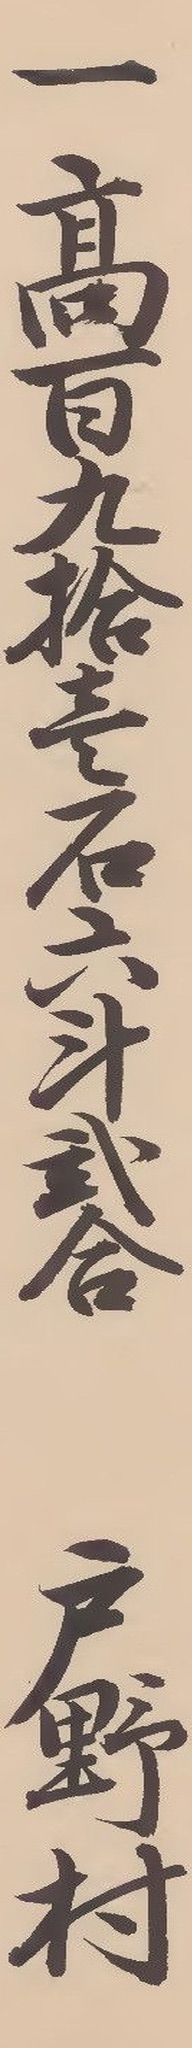一高百九拾壱石六斗弐合戸野村
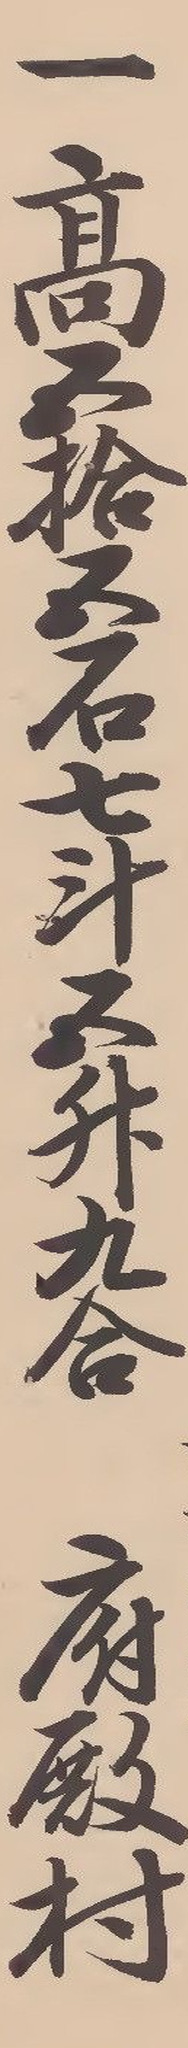一高五拾五石七斗五升九合府殿村

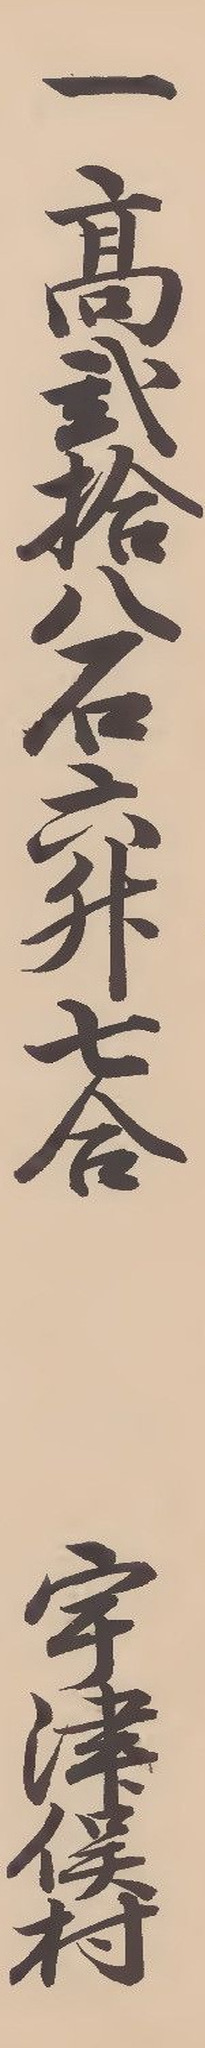一高弐拾八石六升七合宇津俣村
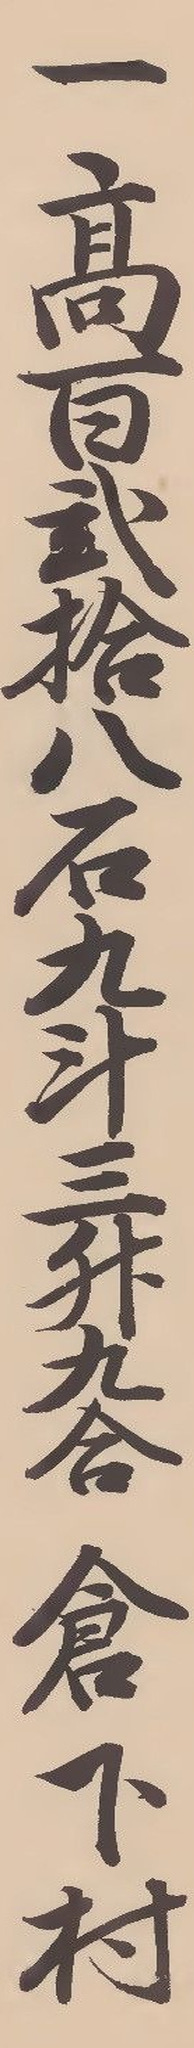一高百弐拾八石九斗三升九合倉下村
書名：越後国郷帳　上
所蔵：国立公文書館 National Archives of Japan
